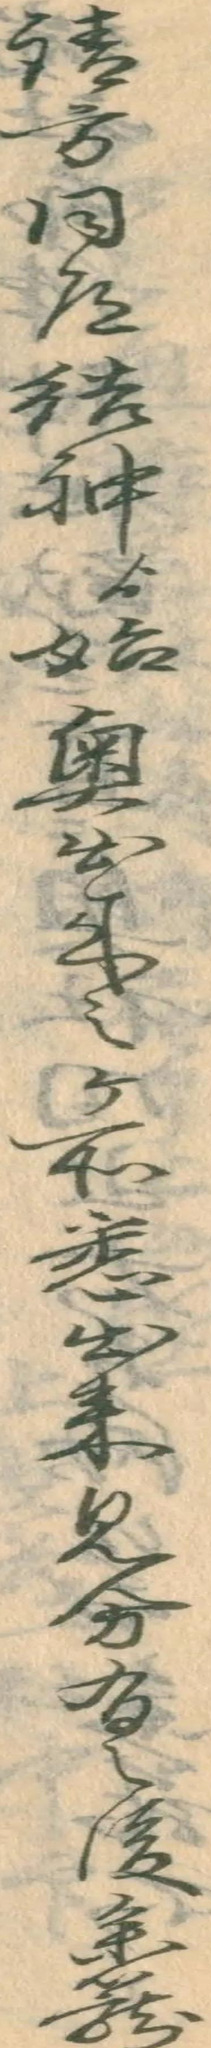請方同道結神ゟ始奥出来之ケ所悉出来見分有之後参籠
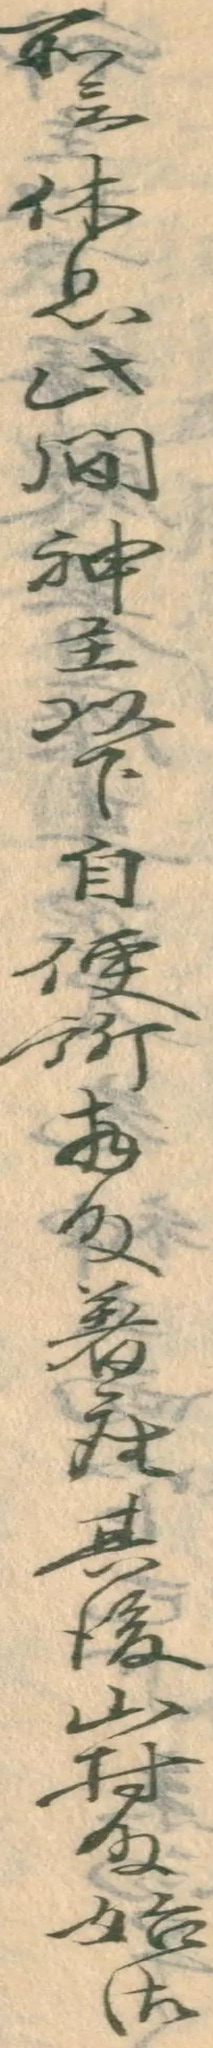所ニ而休息此間神主以下自便所拝殿着座其後山村殿始御
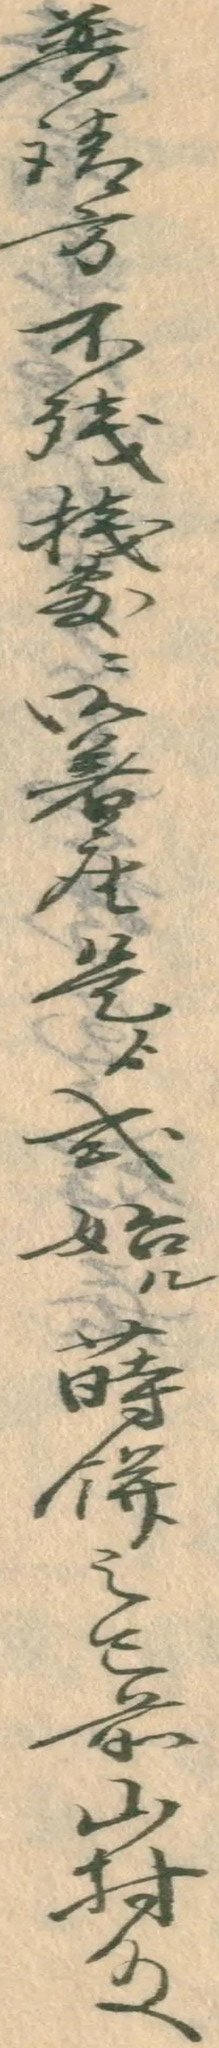普請方不残桟敷ニ御着座是ゟ式始ル蒔餅之已前山村殿
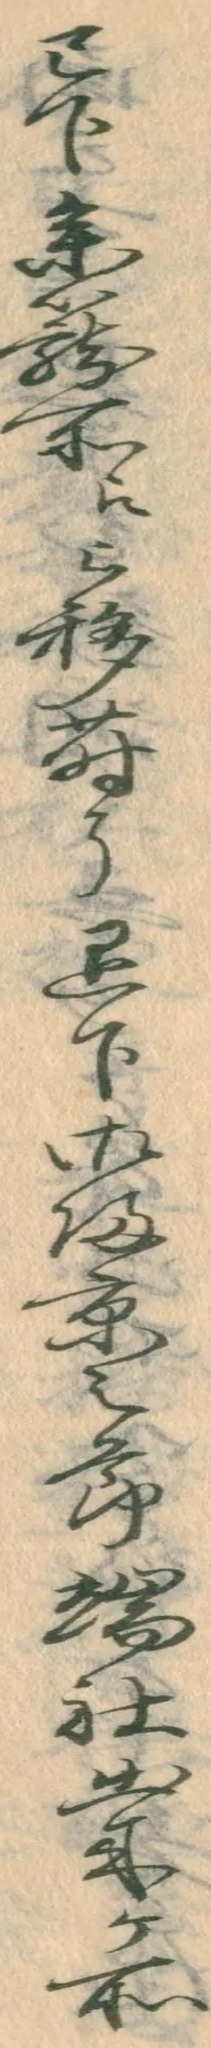已下参籠所江被移蒔了退下御帰京之節端社出来ケ所
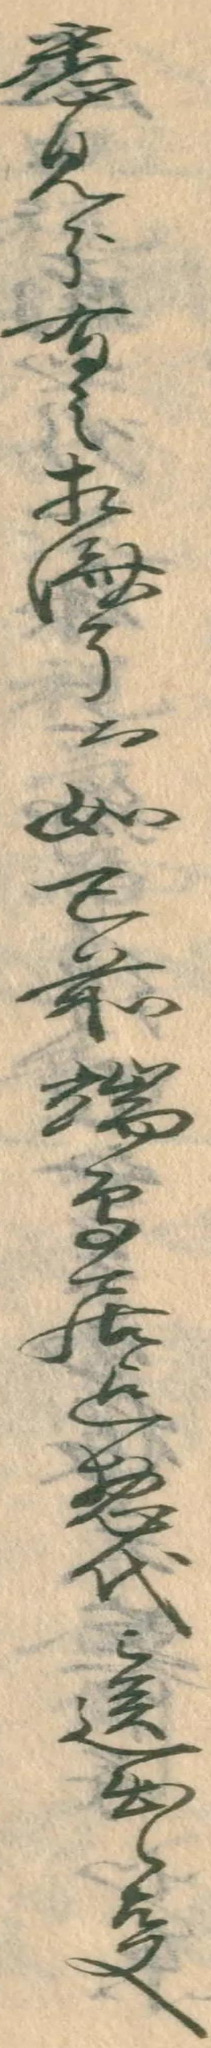悉見分有之相済了而如已前端鳥居迄惣代被送出候事
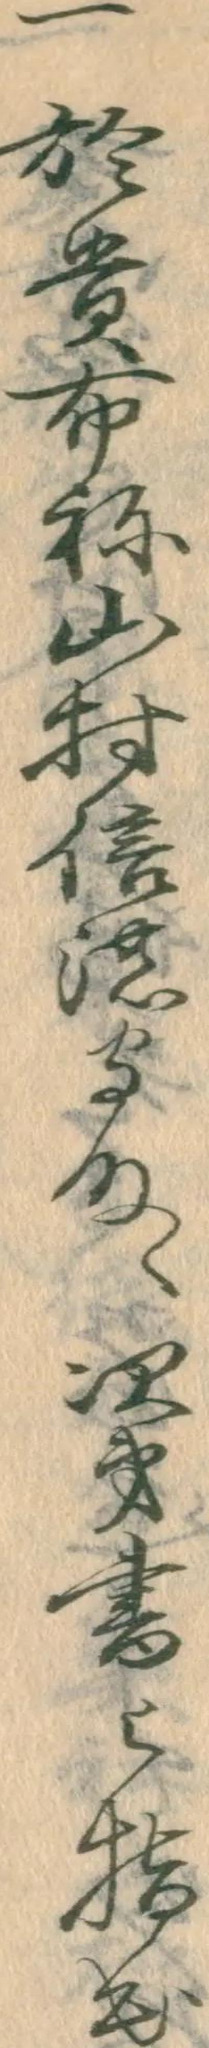一於貴布祢山村信濃守殿へ次第書被指出
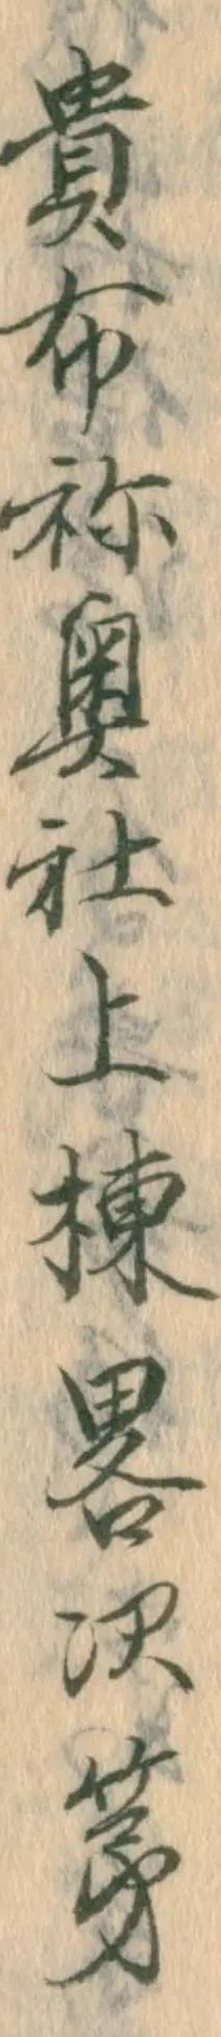貴布祢奥社上棟略次第
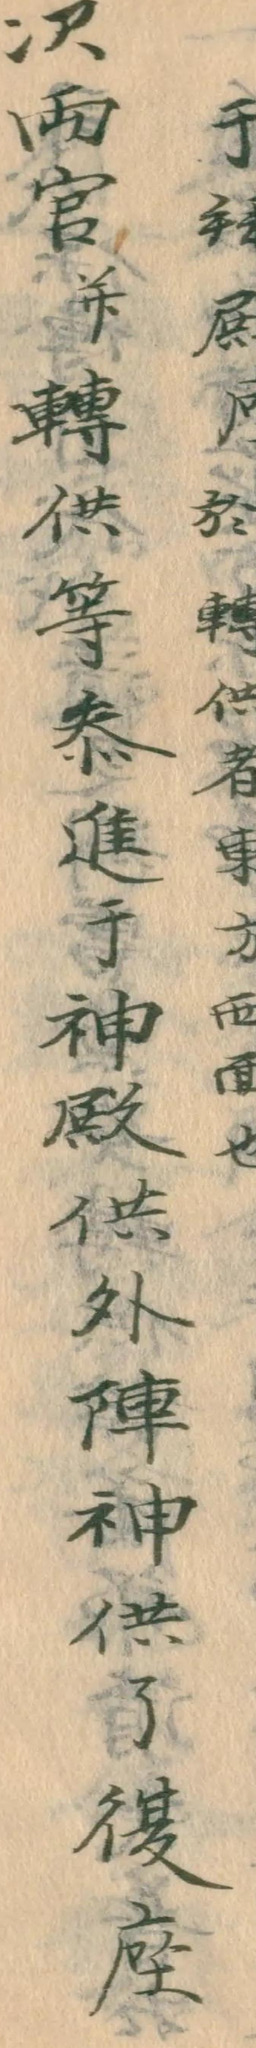次両宮并転供等参進于神殿供外陣神供于復座
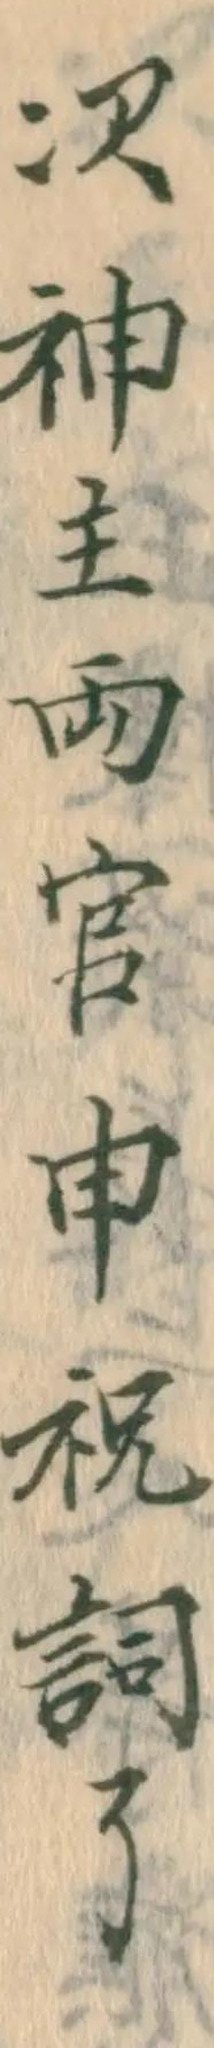次神主両官申祝詞了
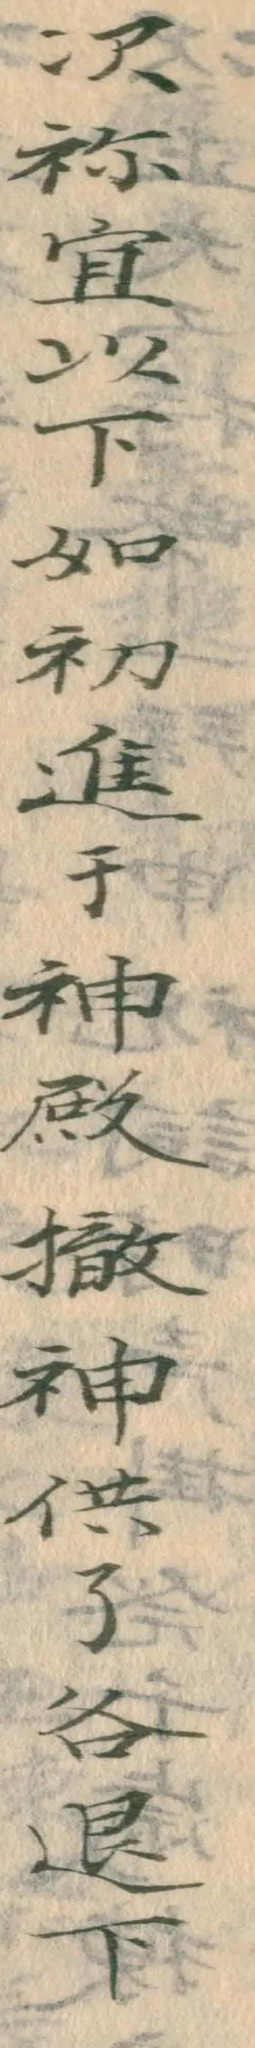次祢宜以下如初進于神殿撤神供了各退下
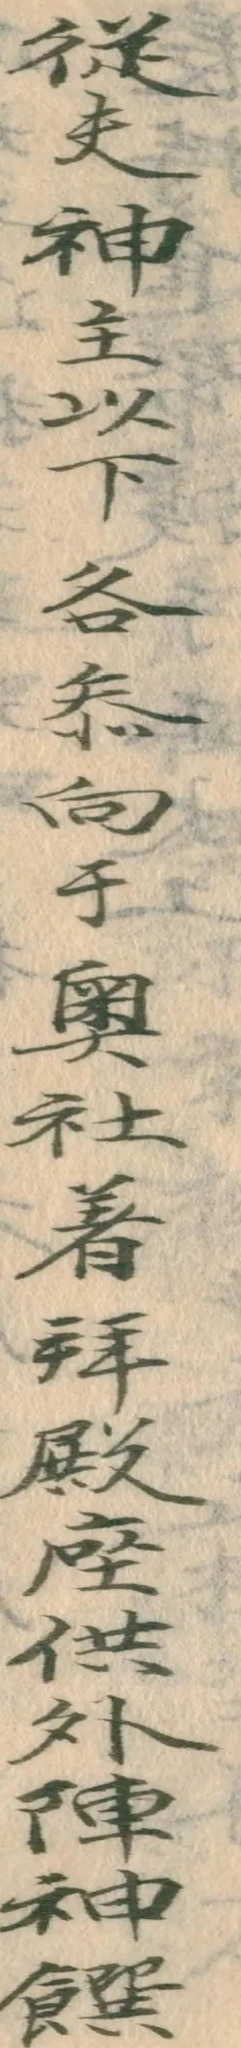従夫神主以下各参向于奥社着拝殿座供外陣神饌
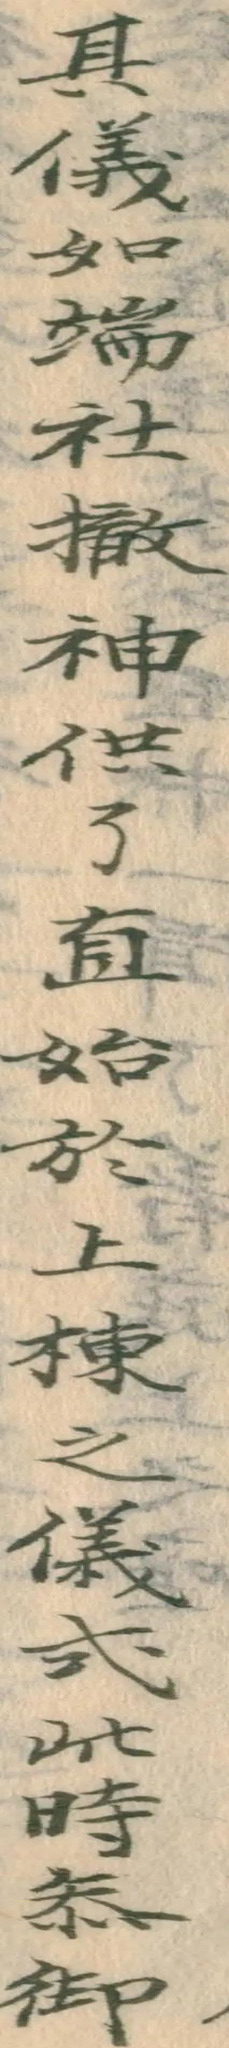其儀如端社撤神供了直始於上棟之儀式此時参御
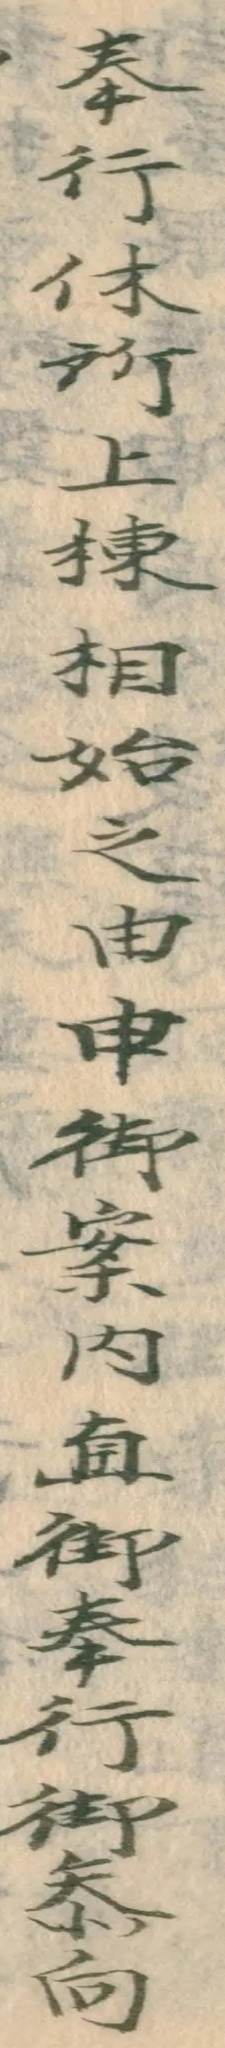奉行休所上棟相始之由申御案内直御奉行御参向
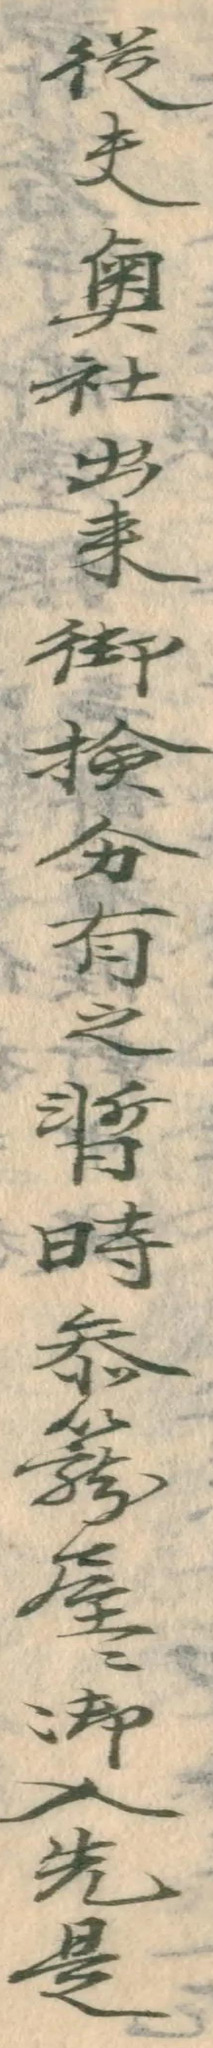従夫奥社出来御検分有之暫時参籠屋ニ御入先是
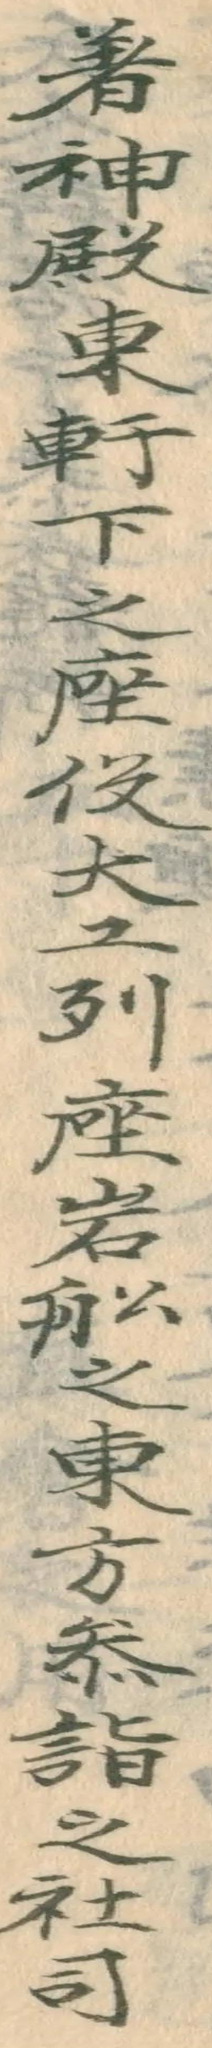着神殿東軒下之座役大工列座岩船之東方参詣之社司

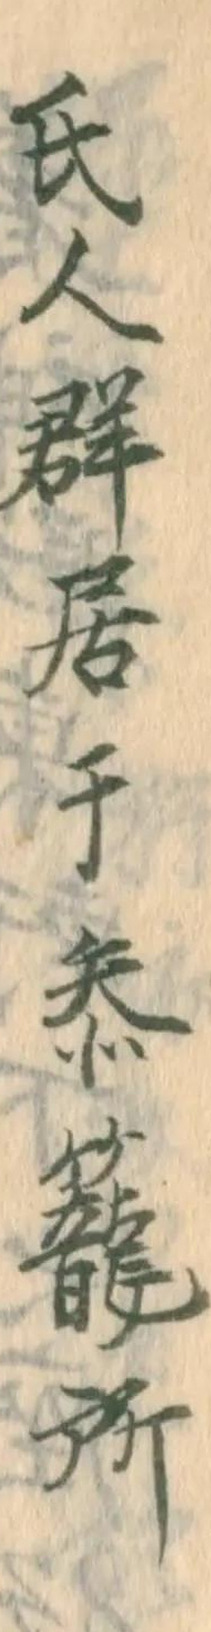氏人群居于参籠所
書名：賀茂社記録. 第17冊
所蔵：国立国会図書館 National Diet Library, JAPAN
